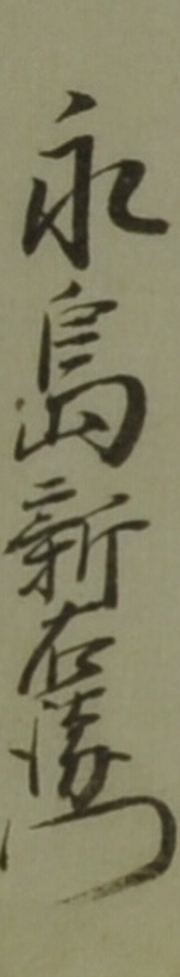永島新右衛門
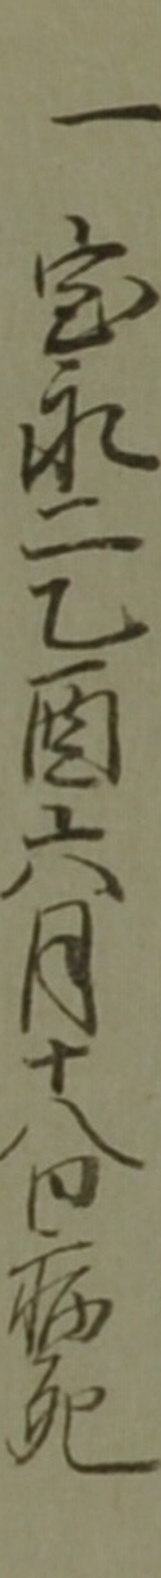一宝永二乙酉六月十八日病死
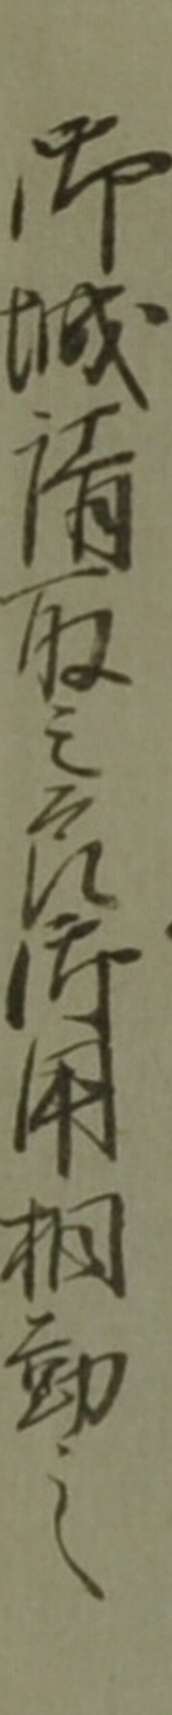御城請取之節御用相勤之
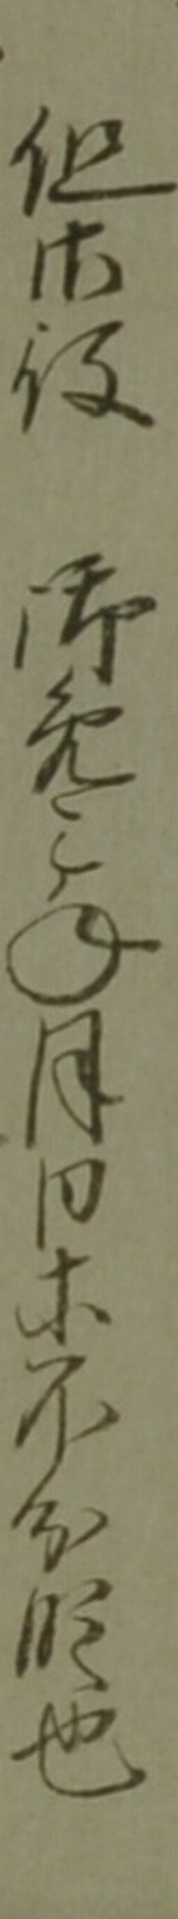但御役御免年月日等不分明也
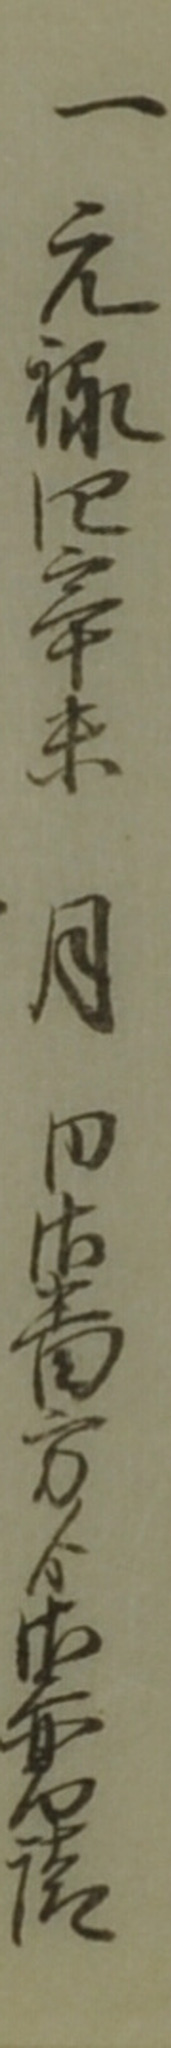一元禄四辛未月日御番方ゟ御普請
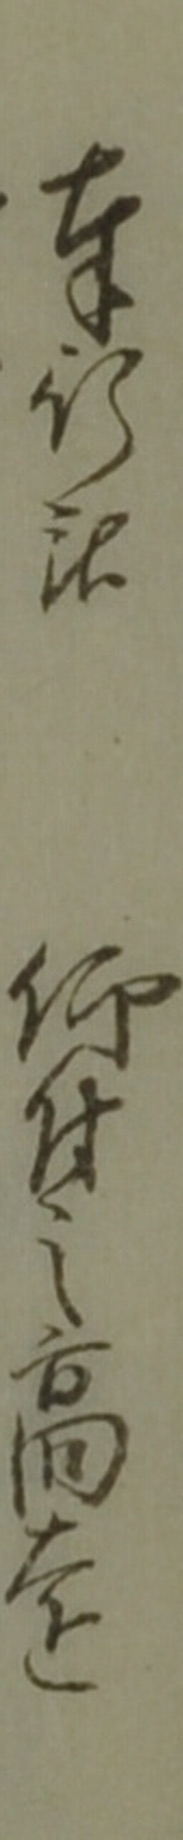奉行被仰付之高遠
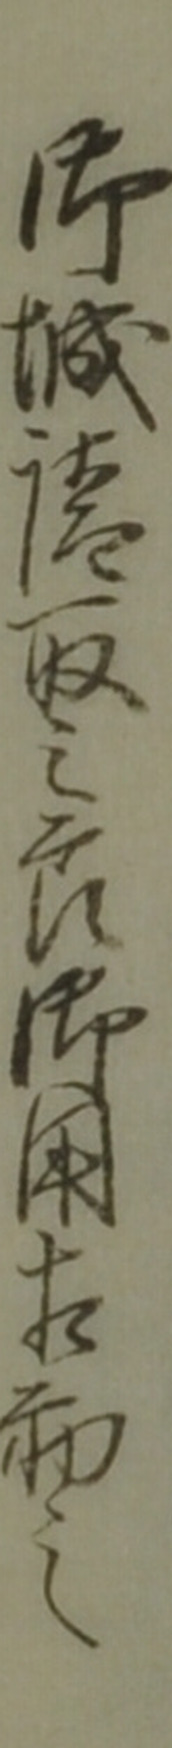御城請取之節御用相勤之
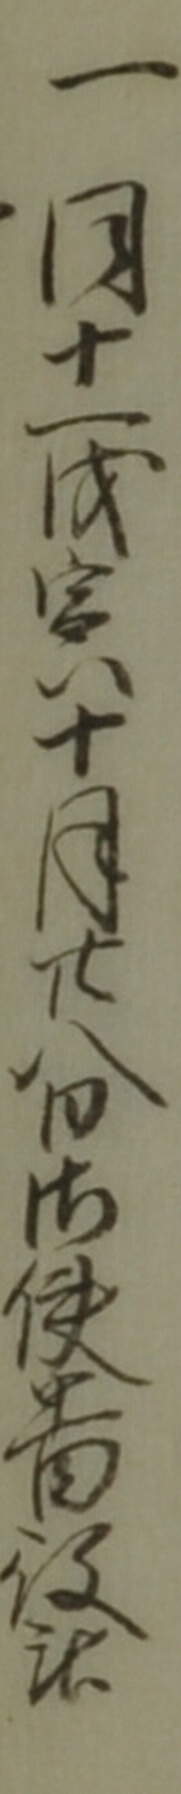一同十一戊寅十月廿八日御使番役被
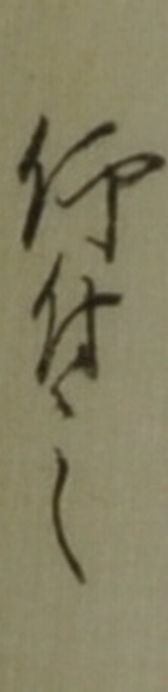仰付之
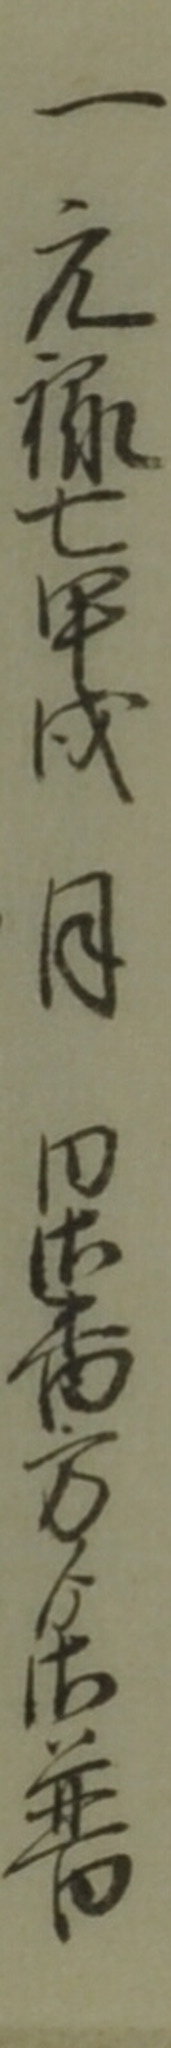一元禄七甲戌月日御番方ゟ御普
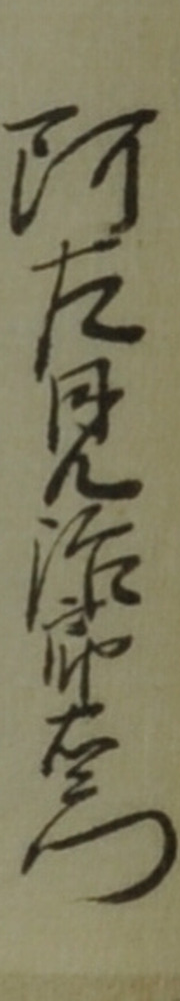阿左見治郎右衛門
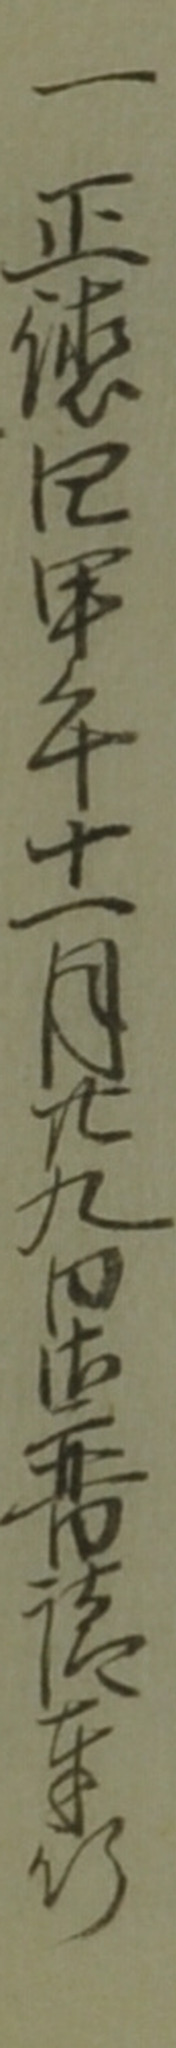一正徳四甲午十一月廿九日御普請奉行
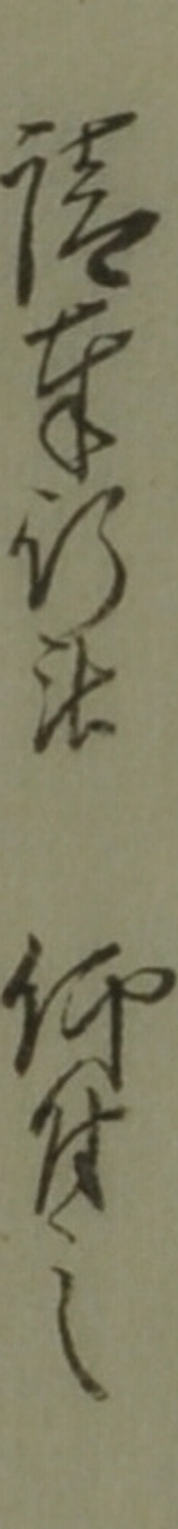請奉行被仰付之
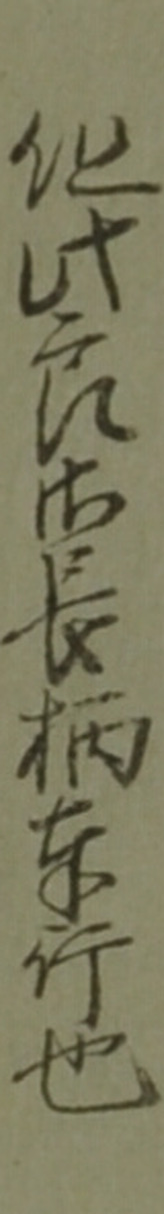但此節御長柄奉行也
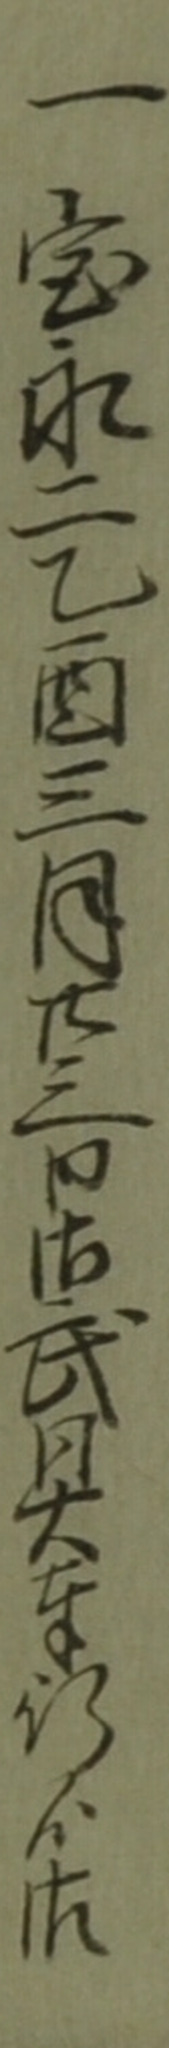一宝永二乙酉三月廿三日御武具奉行ゟ御
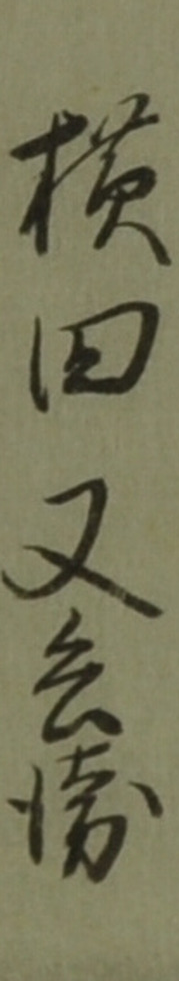横田又兵衛
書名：諸御役代々録（六）
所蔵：伊那市立高遠町図書館・合同会社AMANE
